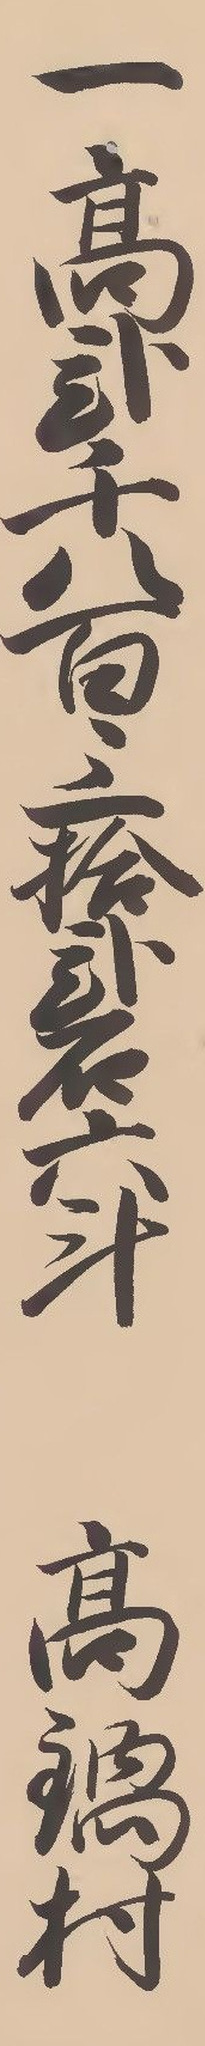一高弐千八百三拾弐石六斗高鍋村
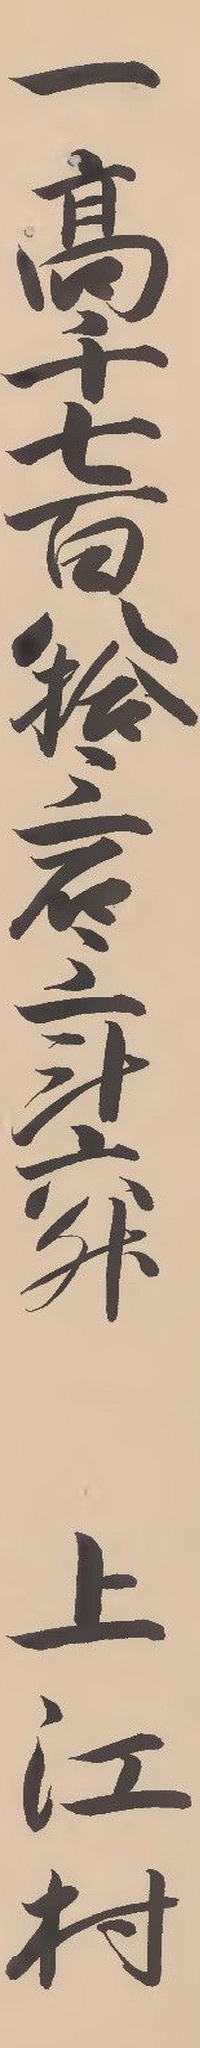一高千七百八拾三石三斗六升上江村
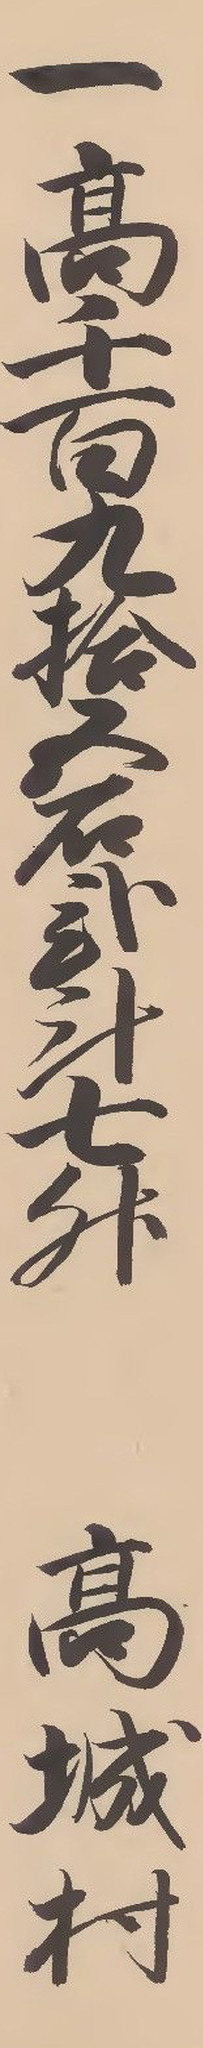一高千百九拾五石弐斗七升高城村
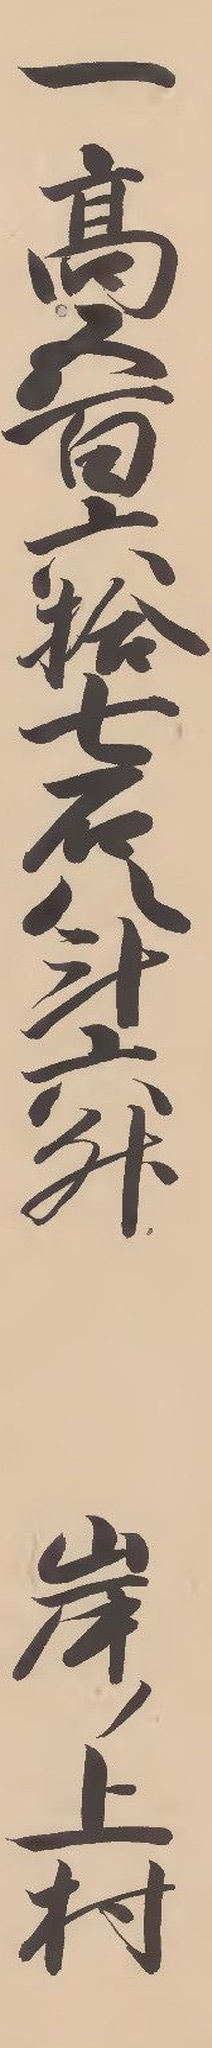一高五百六拾七石八斗六升岸ノ上村
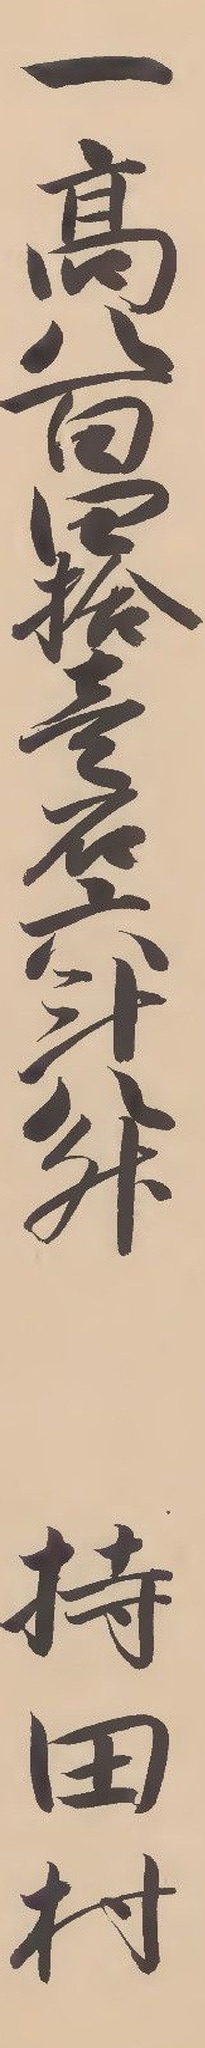一高八百四拾壱石六斗八升持田村

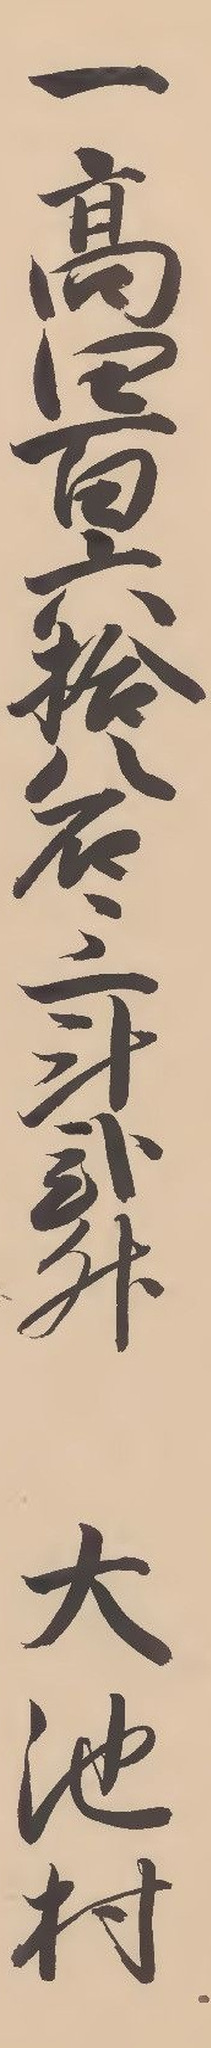一高四百六拾八石三斗弐升大池村
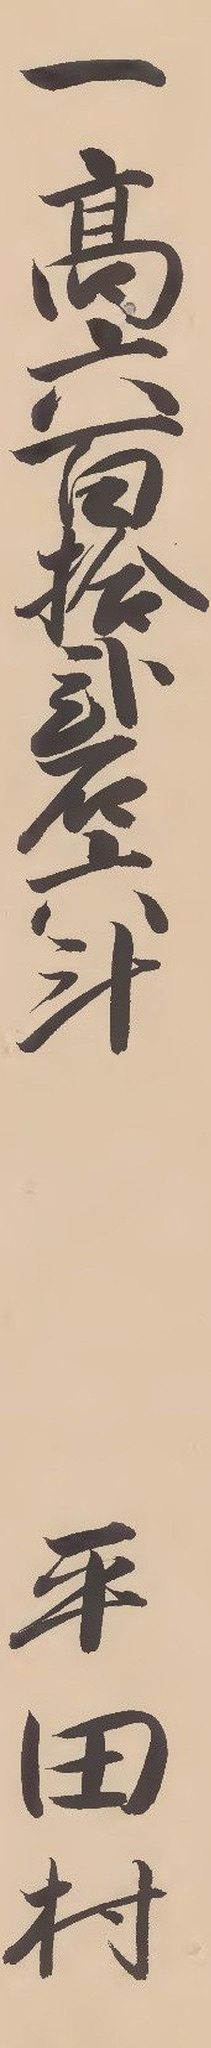一高六百拾弐石六斗平田村
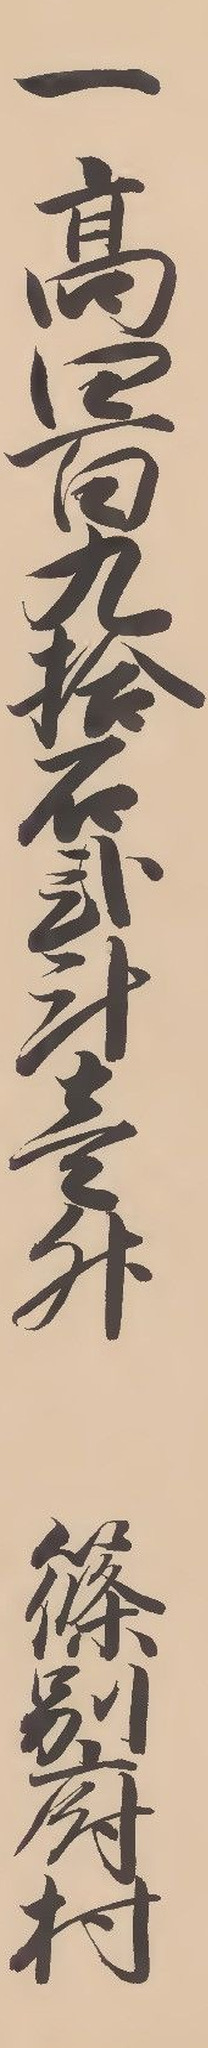一高四百九拾石弐斗壱升篠別府村
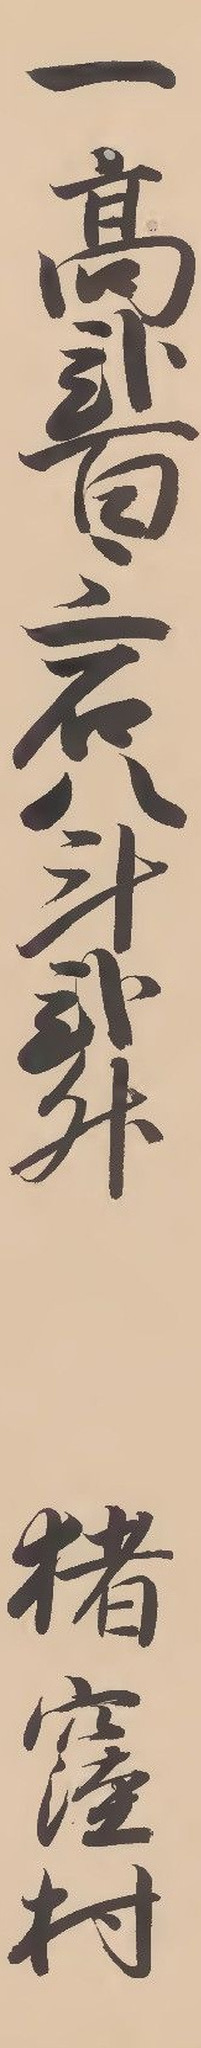一高弐百三石八斗弐升猪窪村
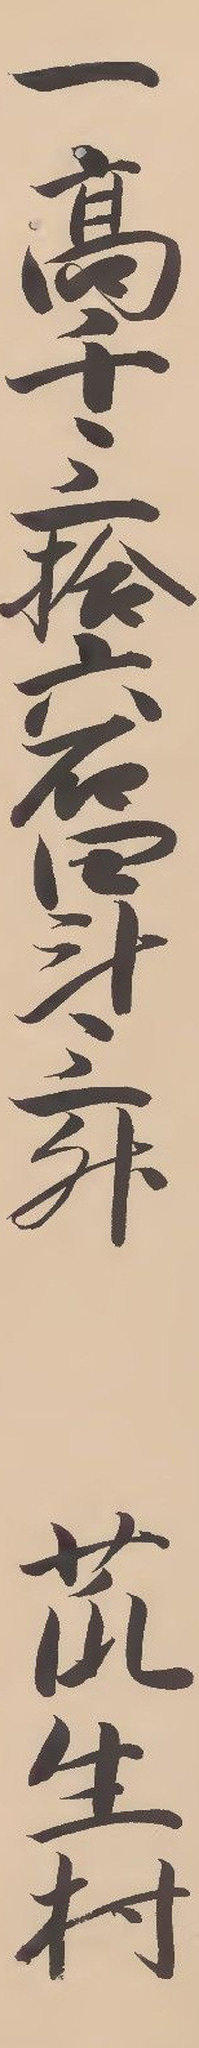一高千三拾六石四斗三升苽生村
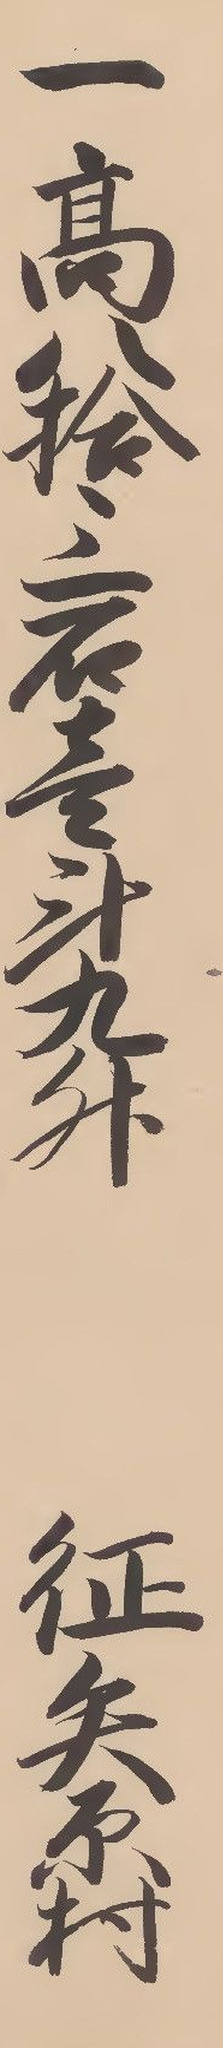一高八拾三石壱斗九升征矢原村
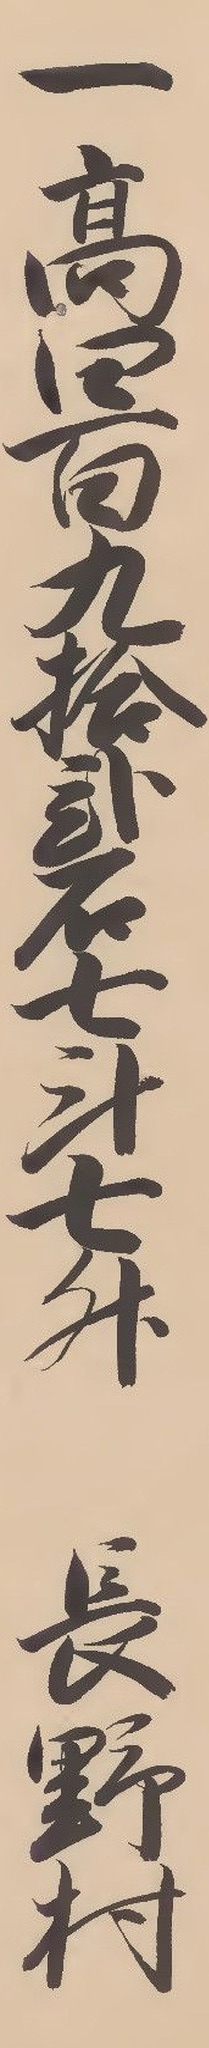一高四百九拾弐石七斗七升長野村
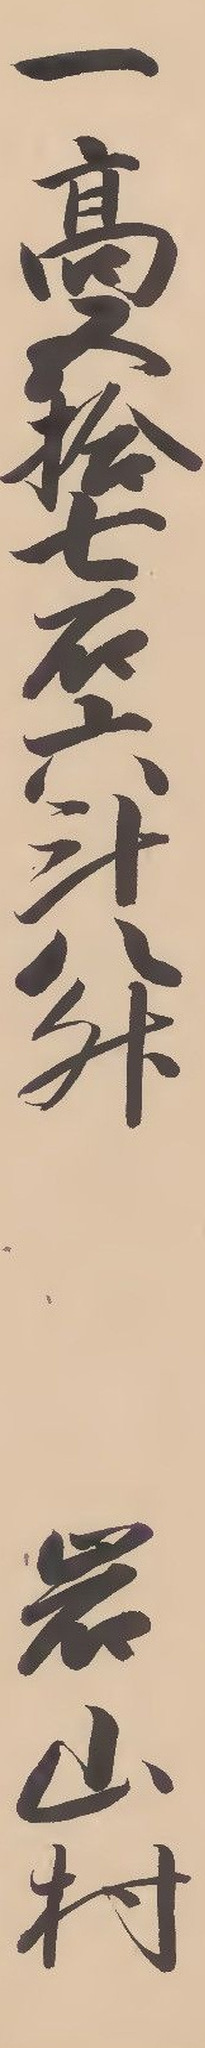一高五拾七石六斗八升岩山村

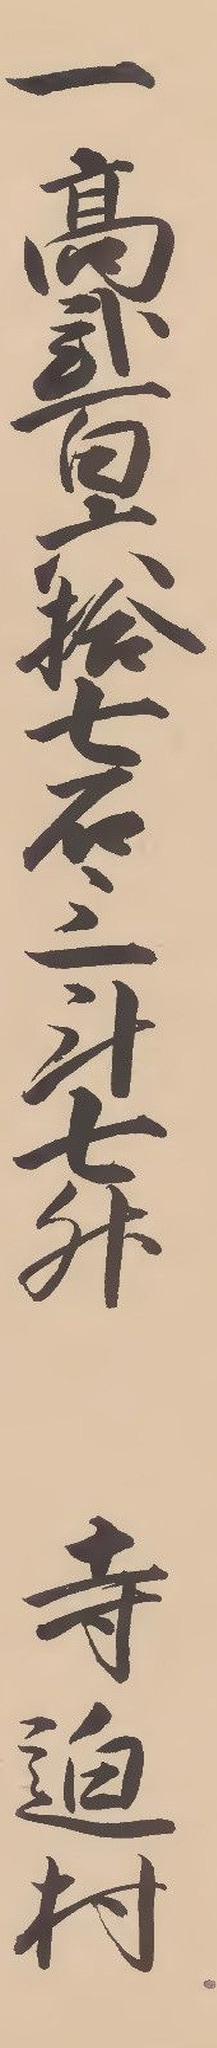一高弐百六拾七石三斗七升寺迫村
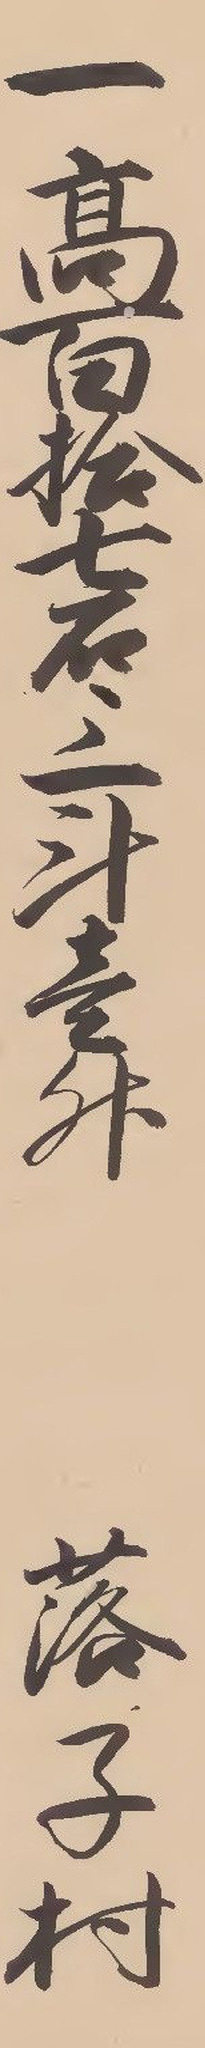一高百拾七石三斗壱升落子村
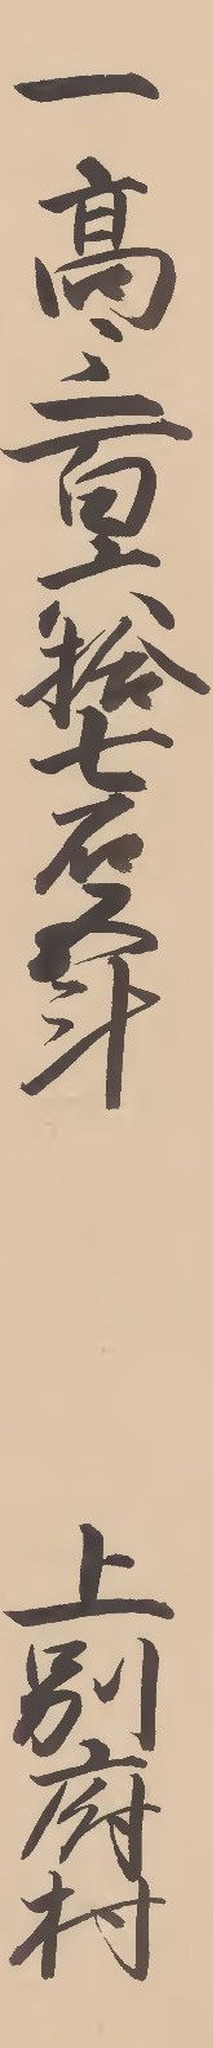一高三百六拾七石五斗上別府村
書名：日向国郷帳
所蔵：国立公文書館 National Archives of Japan
